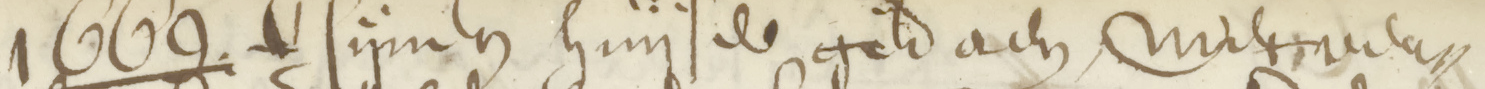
1669. t‛ sijnen huijse gedaen, met ver„
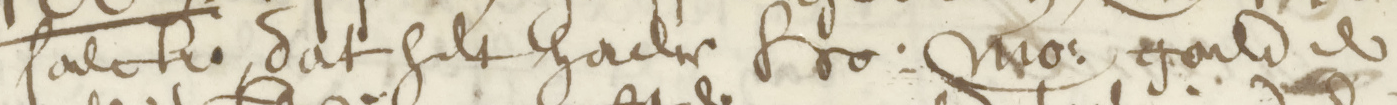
soeck dat het haer Ho:Mo: goede
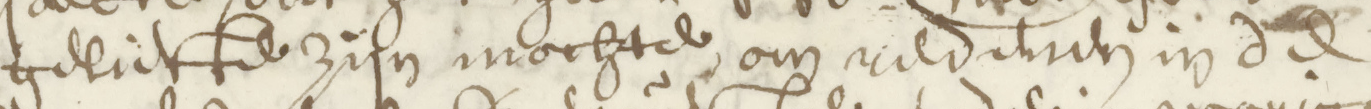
geliefte zijn mochte, om redenen in de
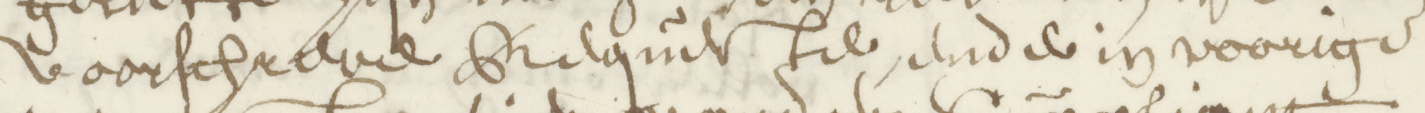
voorschreve Requeste, ende in voorige
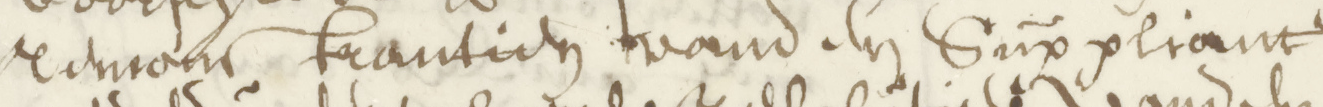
remonstrantien vanden Suppliant
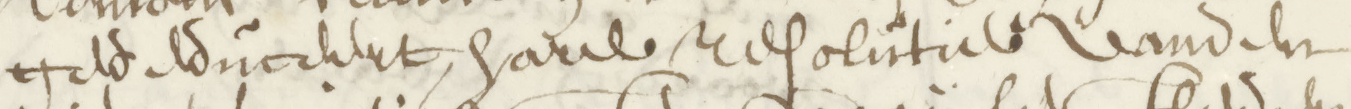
gededuceert, hare resolutie vanden
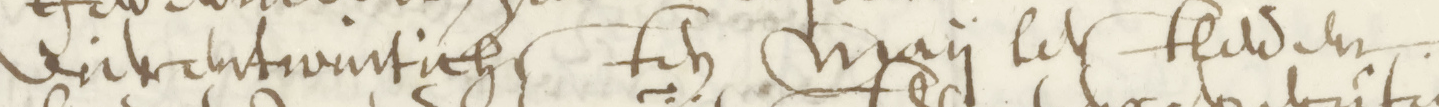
vierentwintichsten Maij lestleden
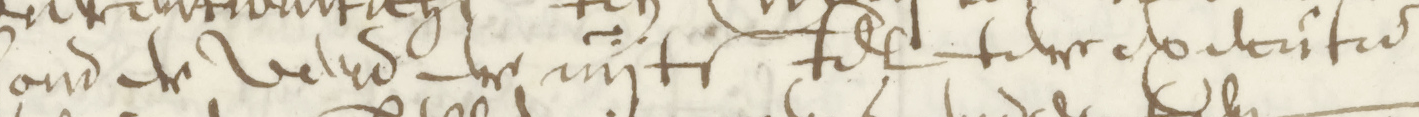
sonder verder uijtstel ter executie
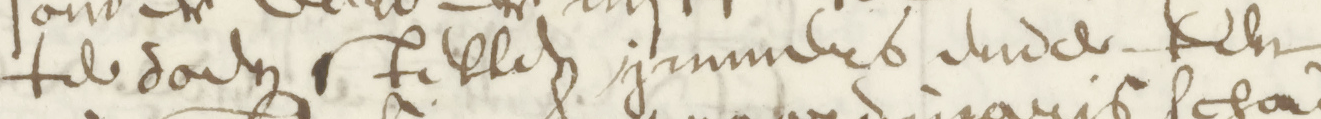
te doen stellen immers ende ten
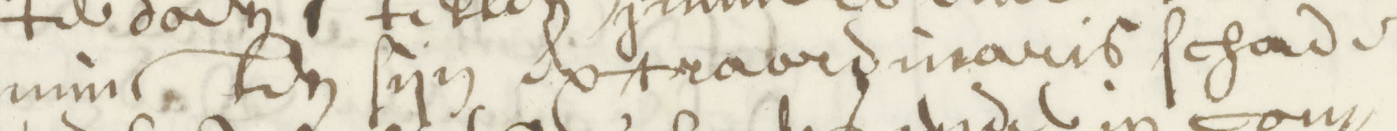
minsten sijn Extraordinaris schade
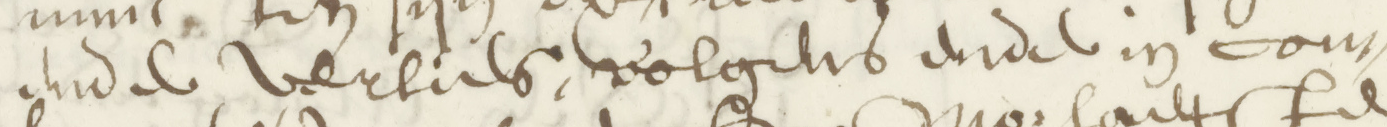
ende verlies, volgens ende in con„
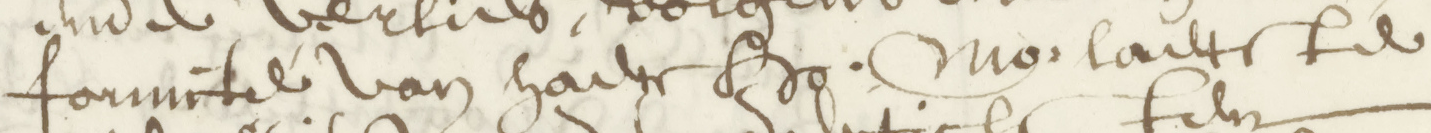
formité van haer Ho:Mo: laetste
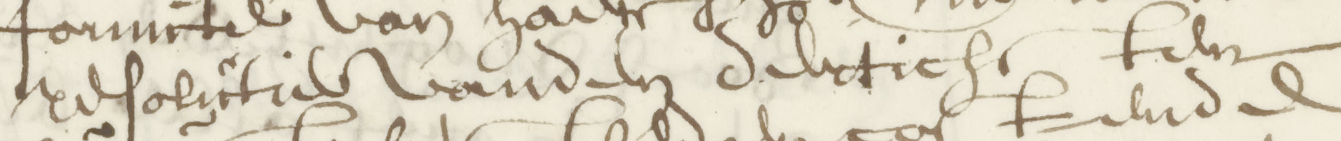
resolutie vanden dertichsten
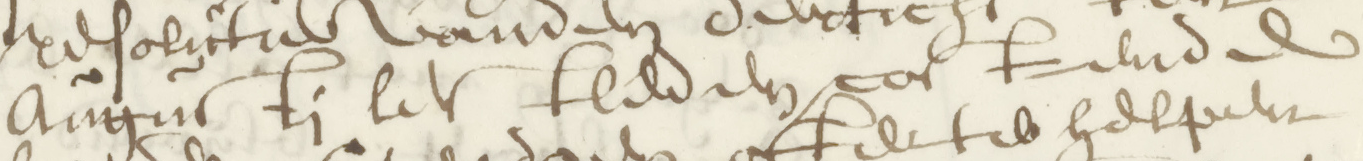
Augusti lestleden, cost ende
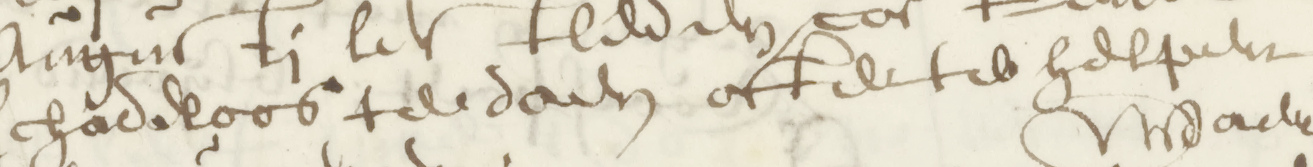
schadeloos te doen ofte te helpen
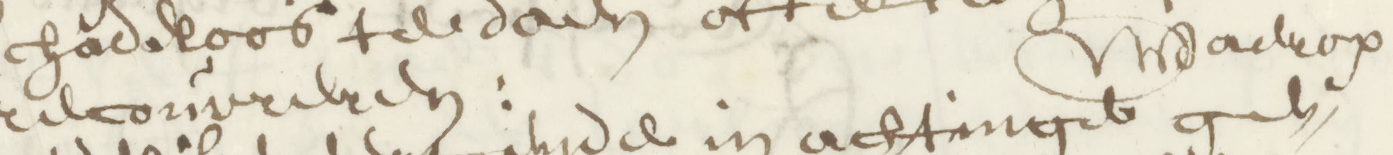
recouvreren: Waerop
